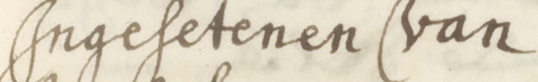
Ingesetenen van
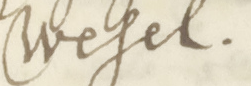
Wesel.
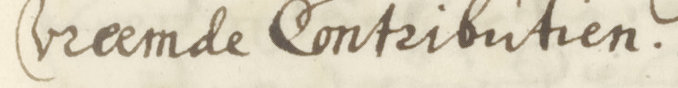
Vreemde Contributien.
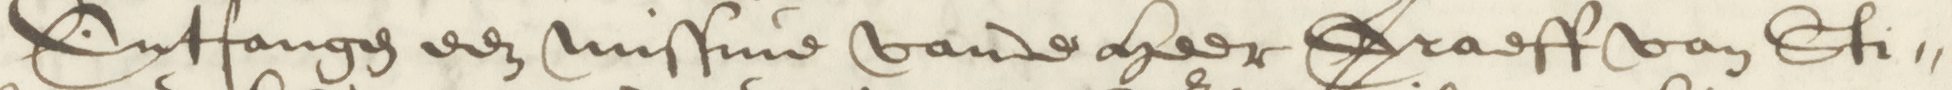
Ontfangen een missiue vande heer Graeff van Sti„
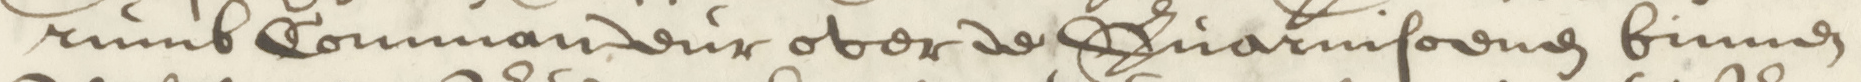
rumb Commandeur over de Guarnisoenen binnen
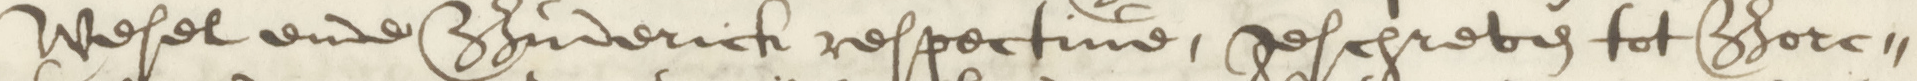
Wesel ende Buderick respectiue, geschreven tot Borc„
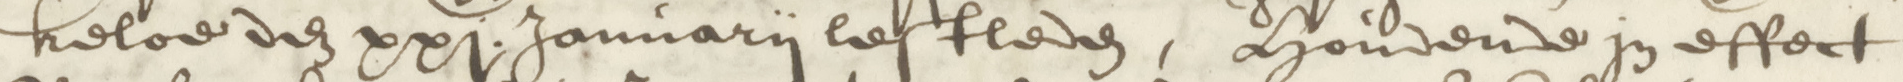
keloe den xxi. Januarij lestleden, houdende in effect
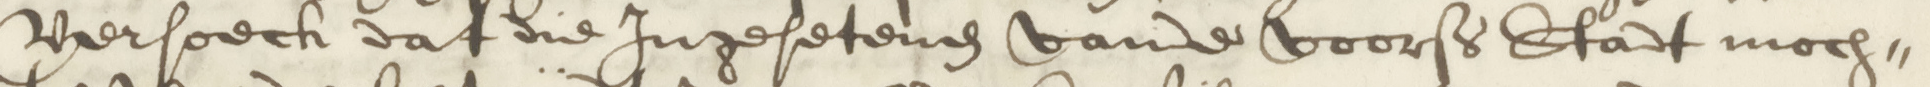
Versoeck dat die Ingesetenen vande voors Stadt moch„
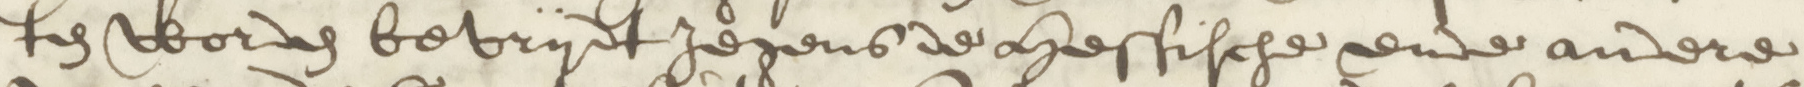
ten worden bevrijdt Jegens de Hessische ende andere
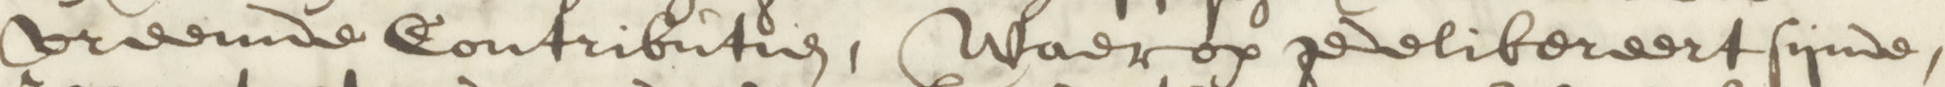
vreemde Contributien. Waerop gedelibereert sijnde,
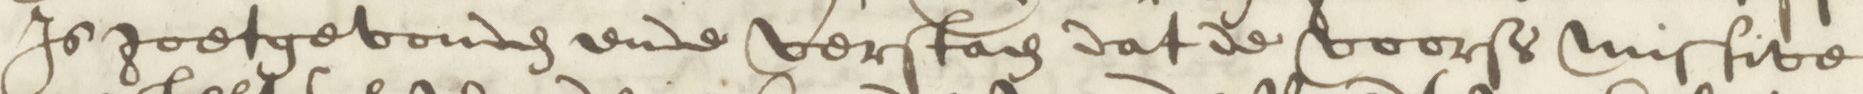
Is goetgevonden ende verstaen dat de voors missive
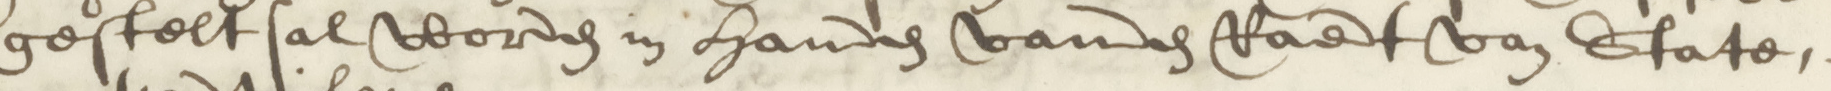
gestelt sal worden in handen vanden Raedt van State, -
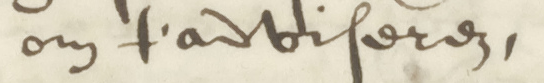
om t‛ adviseren.
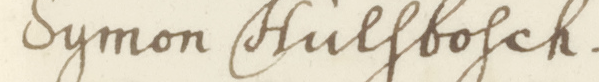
Sijmon Hulsbosch
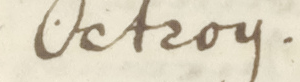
Octroij.
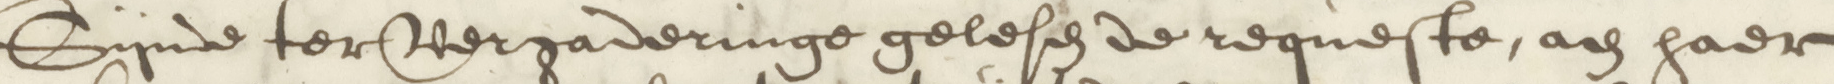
Sijnde ter Vergaderinge gelesen de requeste, aen haer
